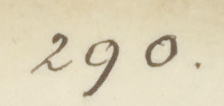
290
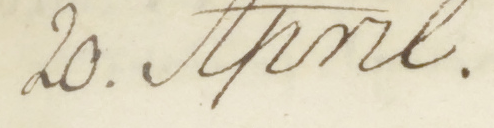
20 April.
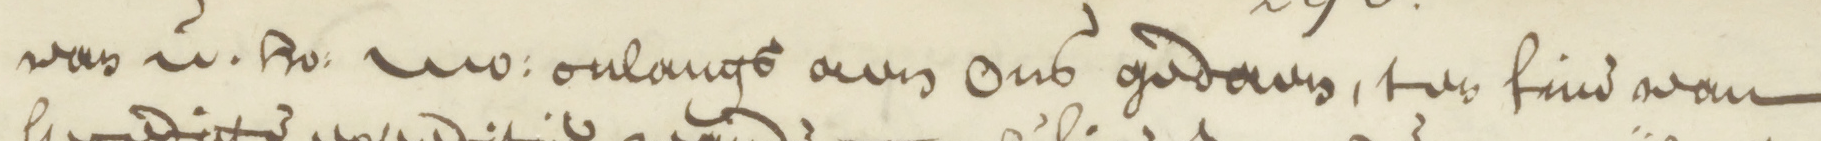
van u. Ho:Mo: onlangs aen ons gedaen. ten fine van
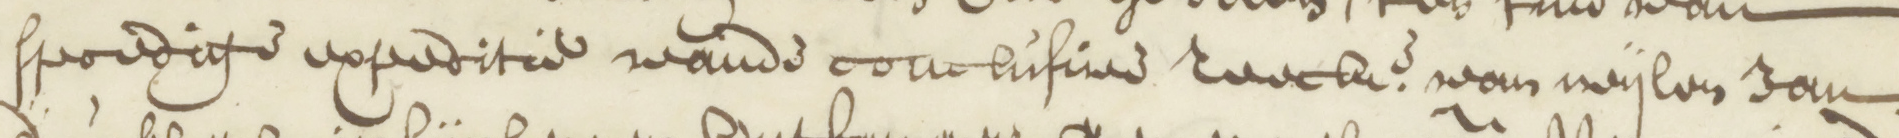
spoedige expeditie vande conclusive reecke. van wijlen Jan
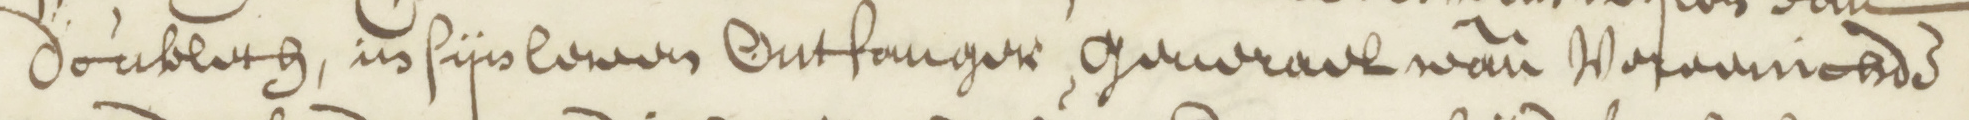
doubleth, in sijn leven Ontfanger Generael van Vereenichde
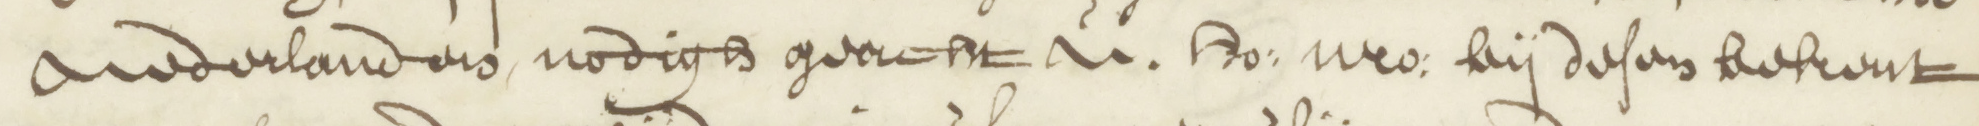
Nederlanden nodigh geacht U. Ho:Mo: bij desen bekent
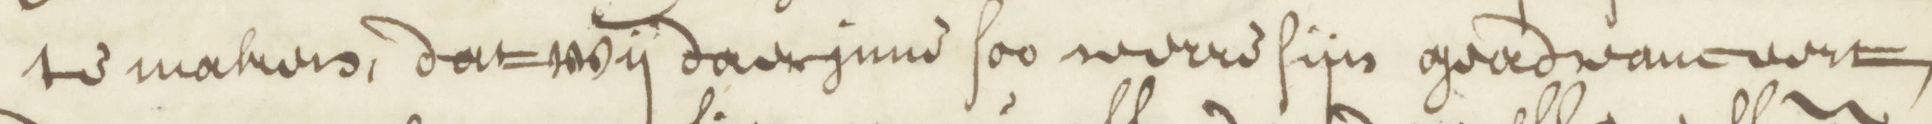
te maken, dat wij daerinne soo verre sijn geadvanceert
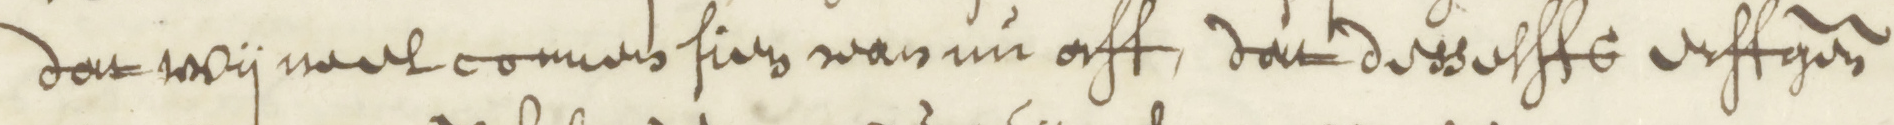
dat wij wel connen sien van nu aff dat desselffs erffgen
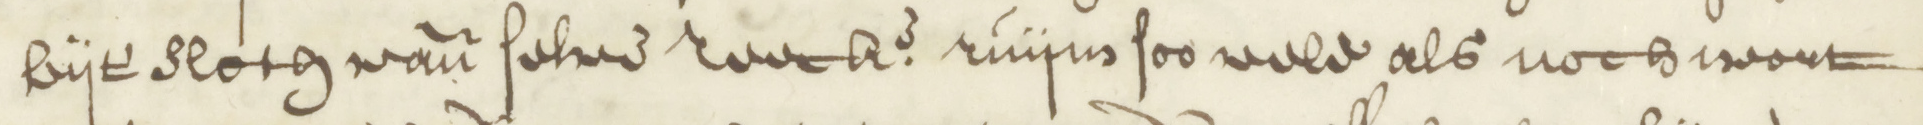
bijt' sloth van selve reecke. ruijm soo vele als noch wort
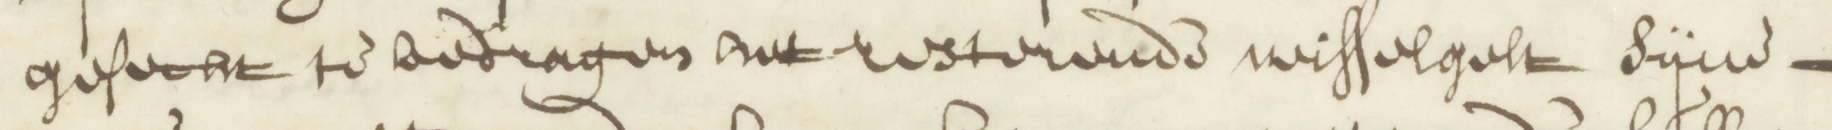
gesecht te bedragen het resterende wisselgelt sijne
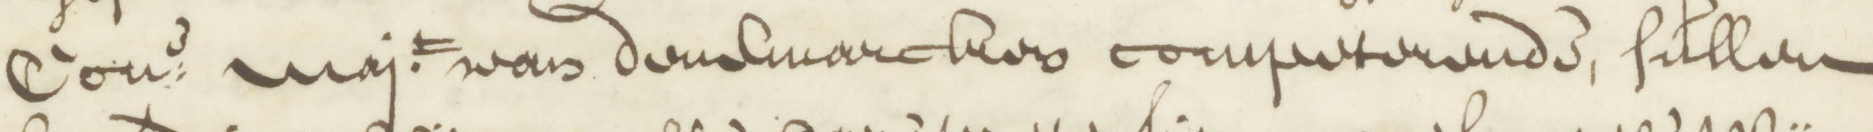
Cone. Majt. van denemarcken competerende, sullen
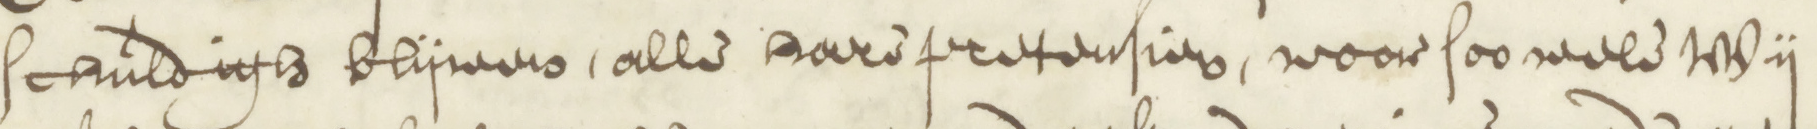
schuldigh blijven, alle hare pretensien voor soo vele tot Wij
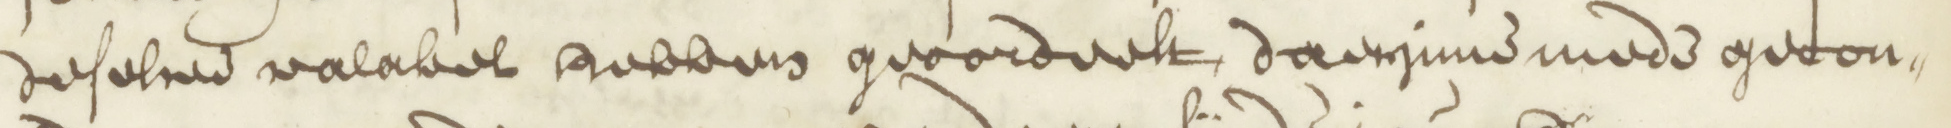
deselve valabel hebben geoordeelt, daerinne mede gecon„
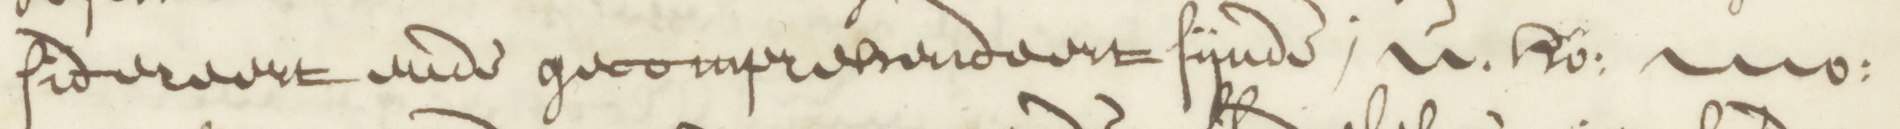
sidereert ende gecomprehendeert sijnde U. Ho:Mo:
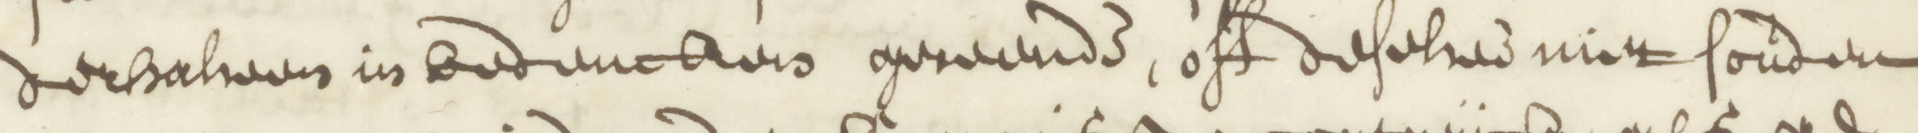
derhalven in bedencken gevende, off deselve niet souden
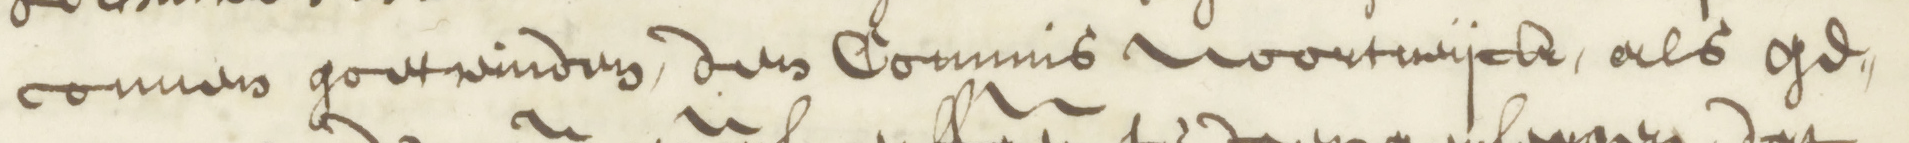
connen goetvinden, den Commis Noortwijck, als ge„
